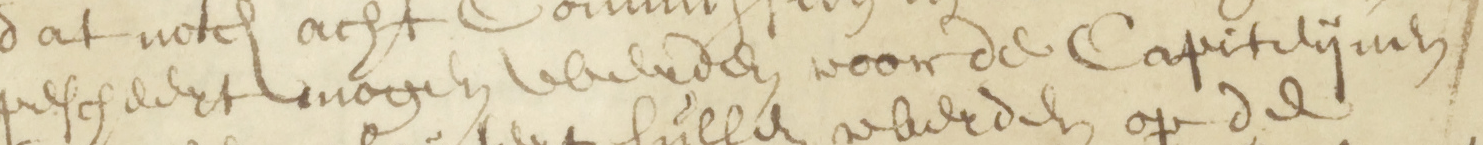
pescheert mogen werden voor de Capiteijnen
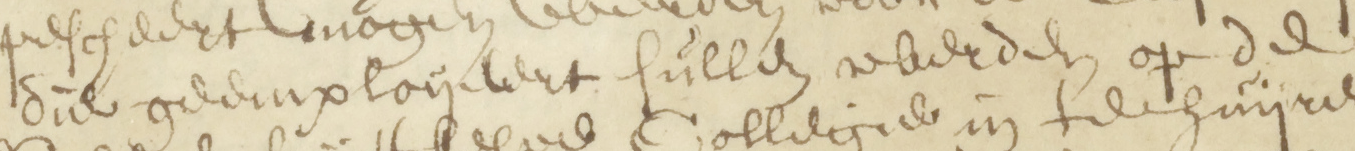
die geemploijeert sullen werden op de
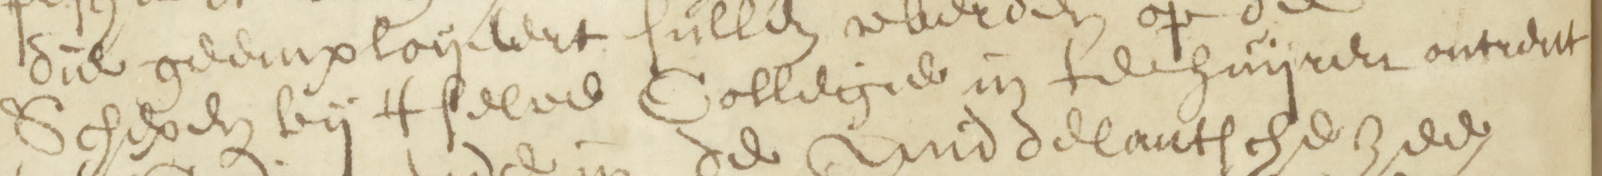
Schepen bij 't selve Collegie in te huijren ontrent
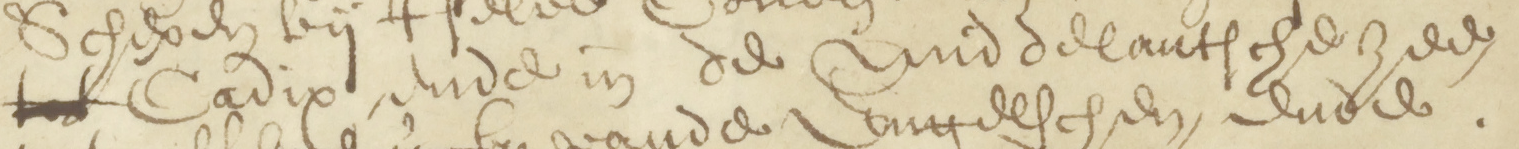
tot Cadix, ende in de Middelantsche Zee,
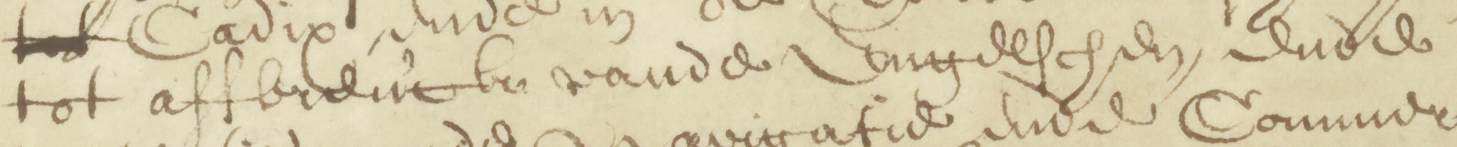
tot affbreuck vande Engelschen, Ende
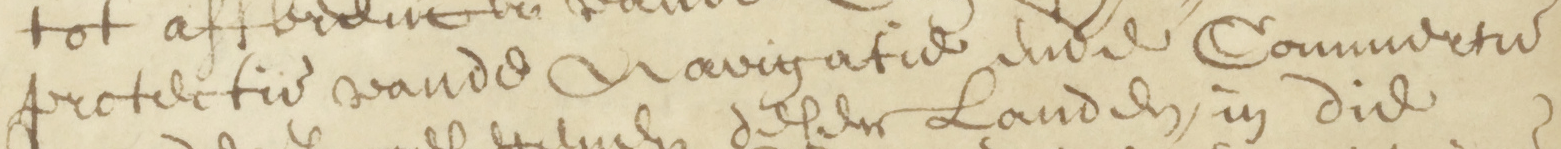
protectie vande Navigatie ende Commertie
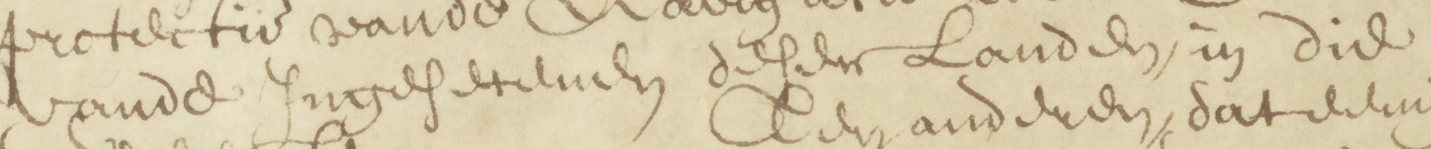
vande Ingesetenen deser Landen, in die
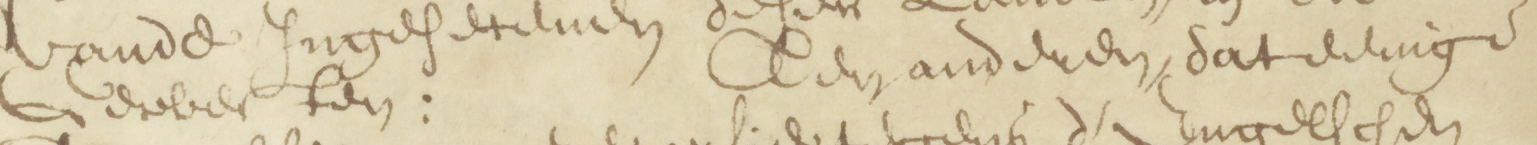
Gewesten. Ten anderen, dat eenige
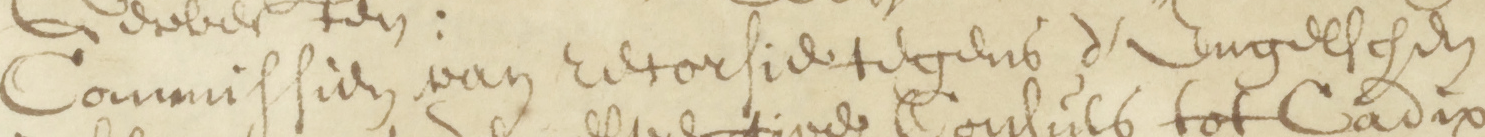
Commissien van retorsie tegens d'Engelschen
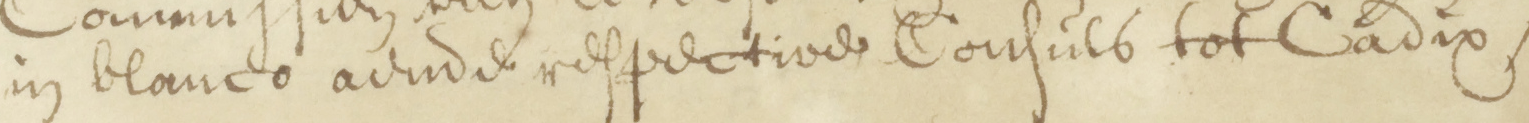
in blanco aende respective Consuls tot Cadix
